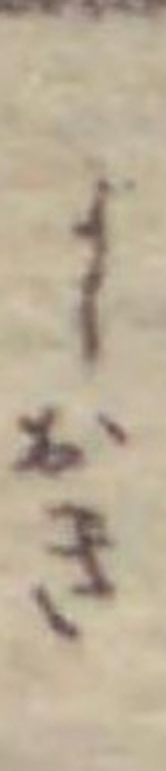よしおき
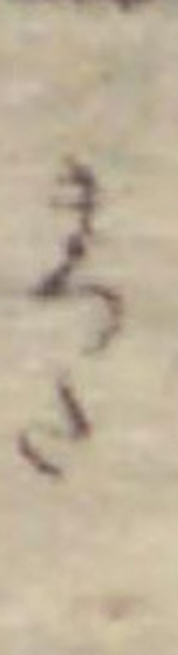まつた
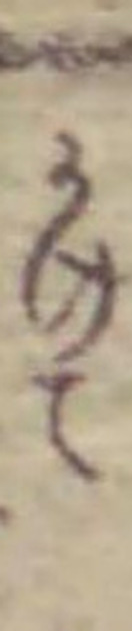かけて

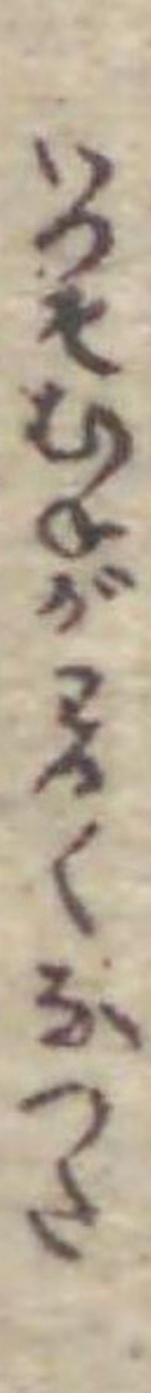いつしむねがわるくなつた
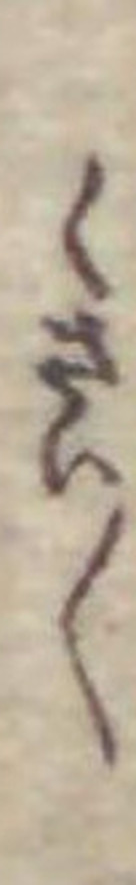くさい〴〵
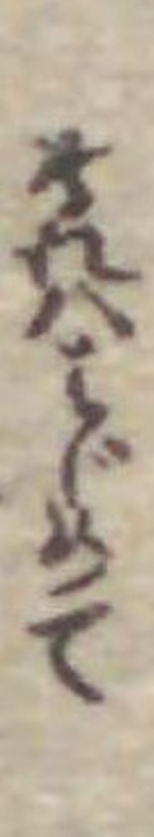それははじめて
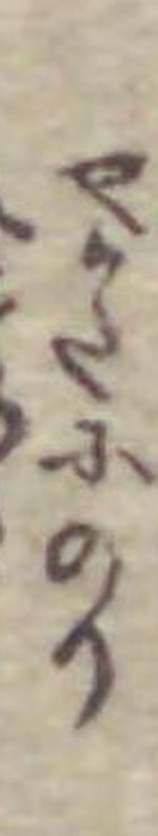やかたにのり
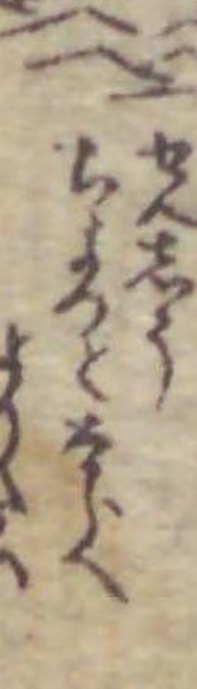ちよつと太郎へ
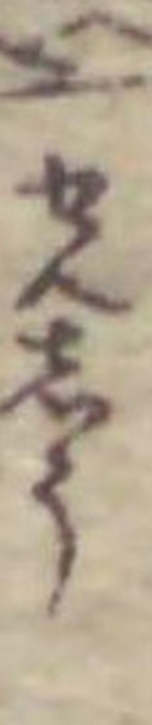せんしう
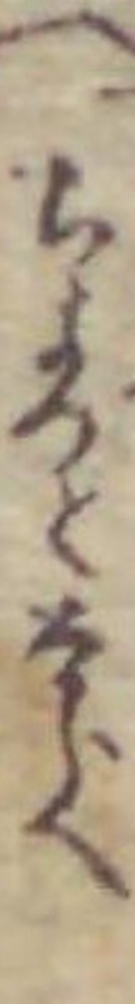ちよつと太郎へ
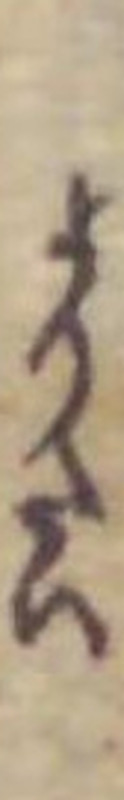よりたい
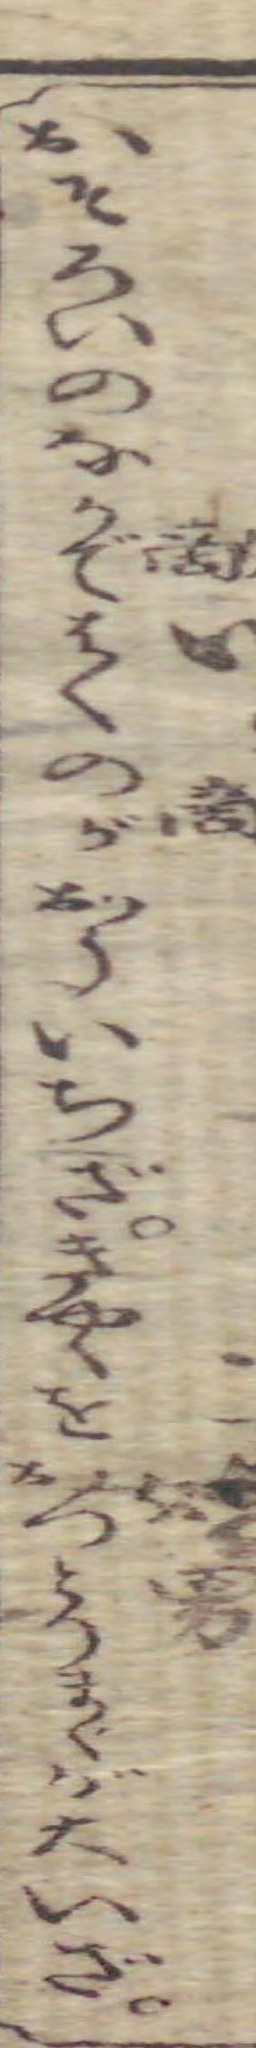おそろいのなかではくのがおういちざ。きやくをおつとりまくが大いざ。
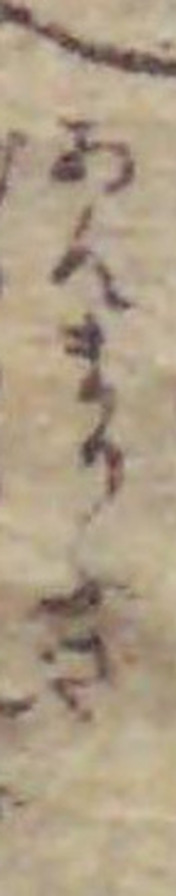あんまりふさ

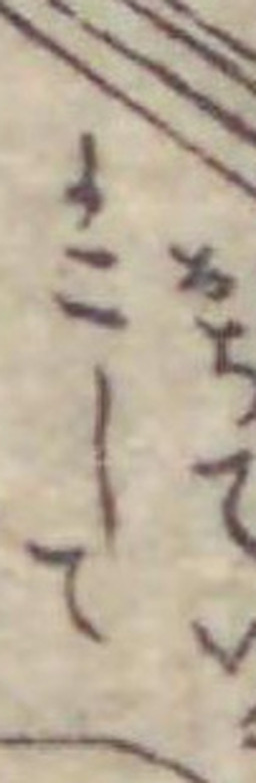よこして
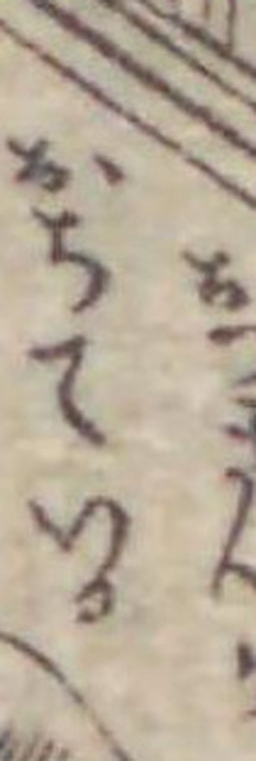おちている
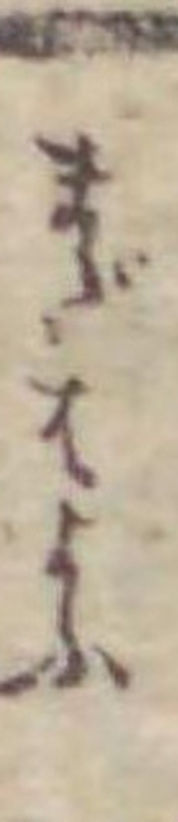まだはよふ
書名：郭𦽳費字尽 : 3巻
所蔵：国立国会図書館 National Diet Library, JAPAN
